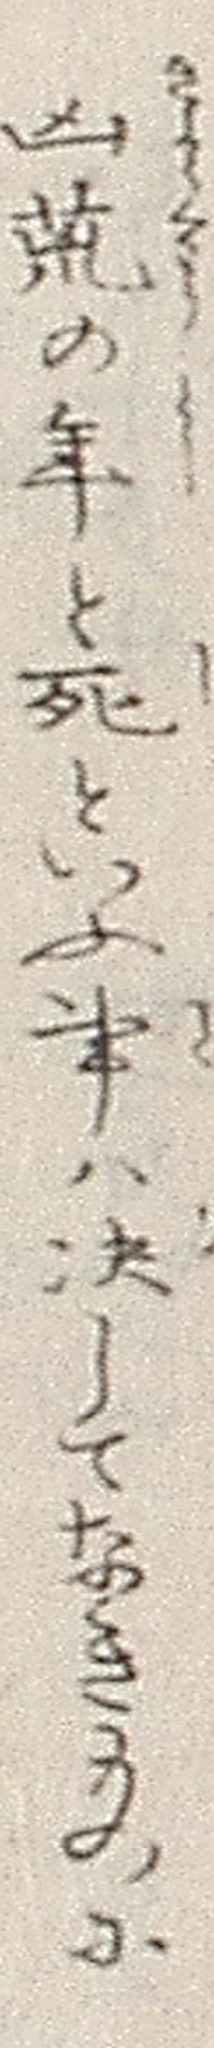凶荒の年と死といふ事は決してなきものに
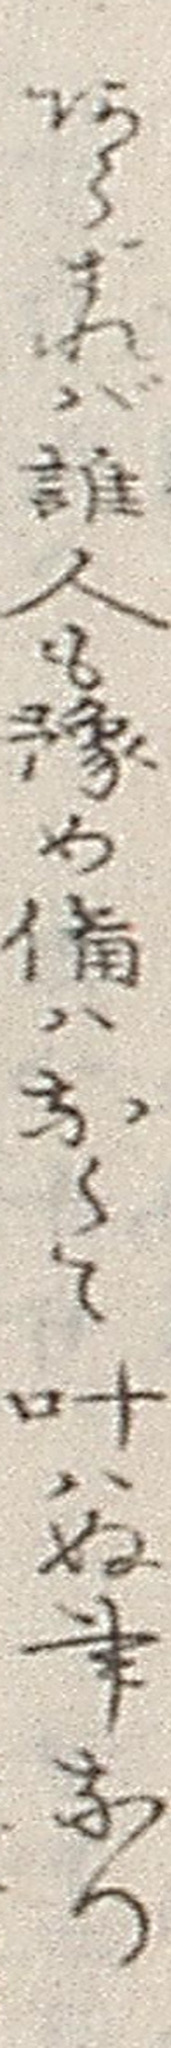あらざれば誰人も豫め備はなくて叶はぬ事なり
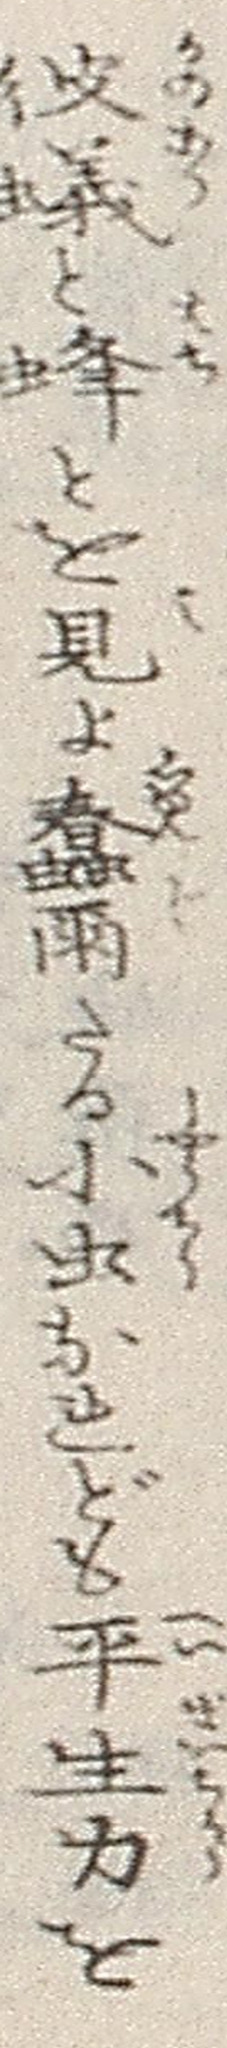彼蟻と蜂とを見よ蠢爾たる小虫なれども平生力を
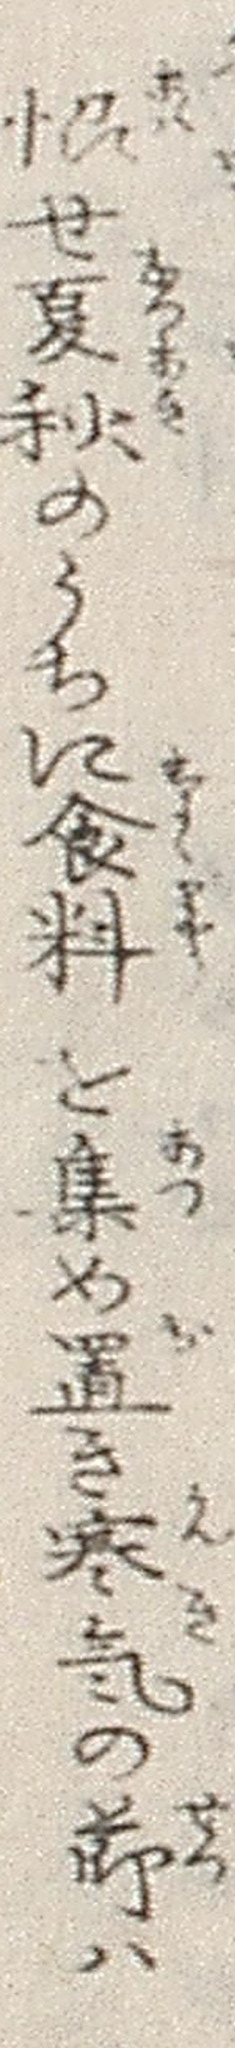協せ夏秋のうちに食料を集め置き寒気の節は
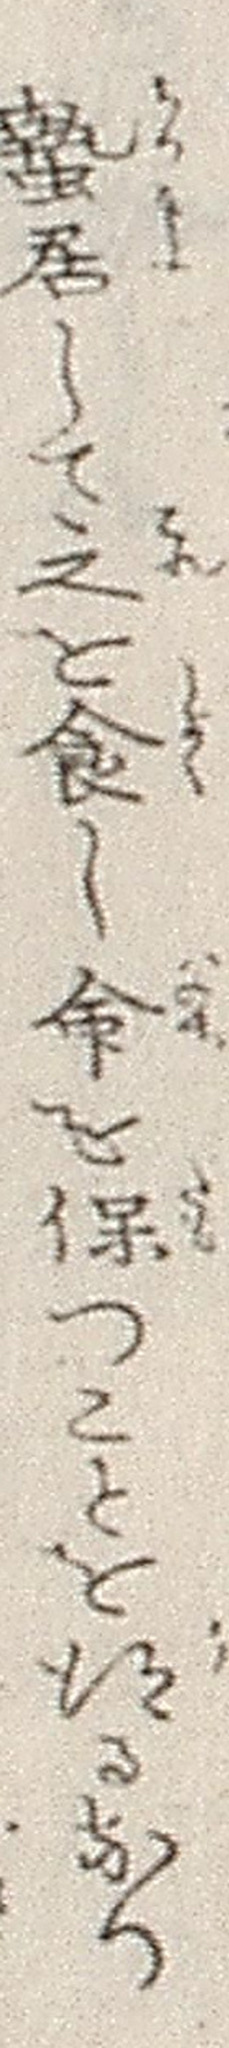蟄居して之を食し命を保つことを得るなり
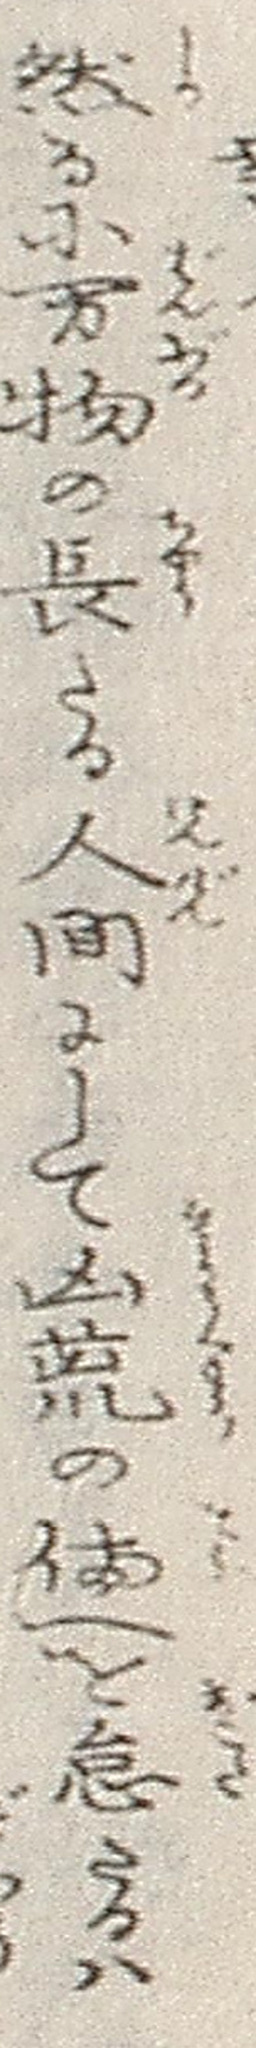然るに万物の長たる人間にして凶荒の備へを怠たるは
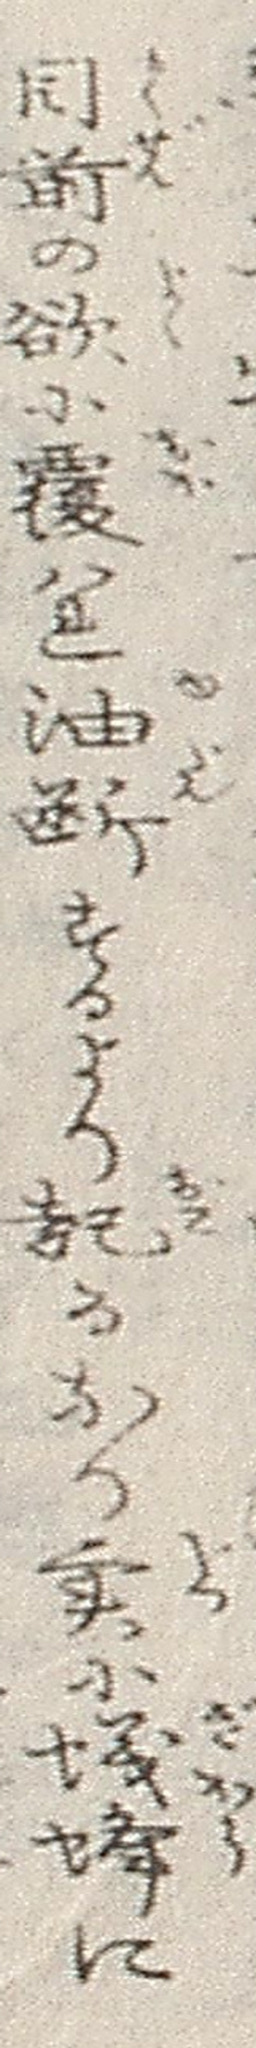目前の欲に覆はれ油断するより起るなり実に蟻蜂に
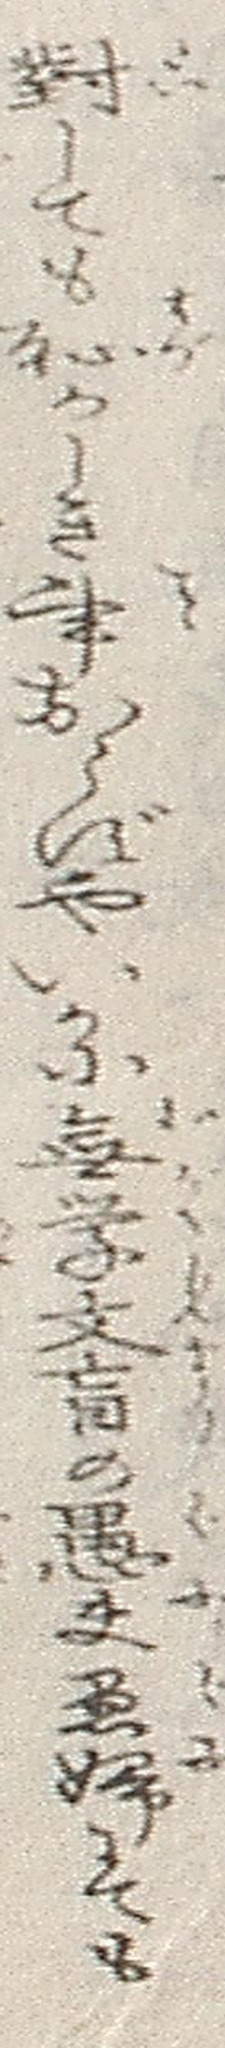対しても恥かしき事ならずやいかに無学文盲の愚夫愚婦にても
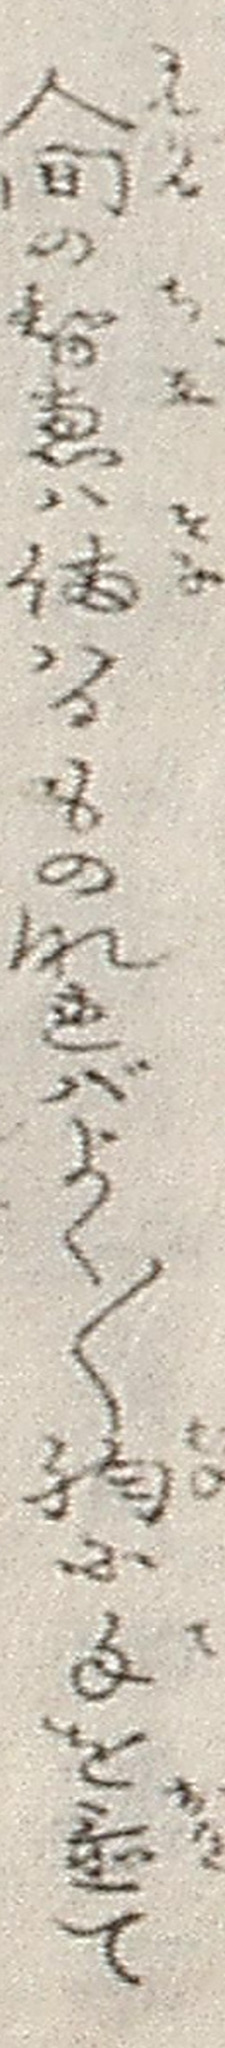人間の智恵は備はるものなればよく〳〵胸に手を置て
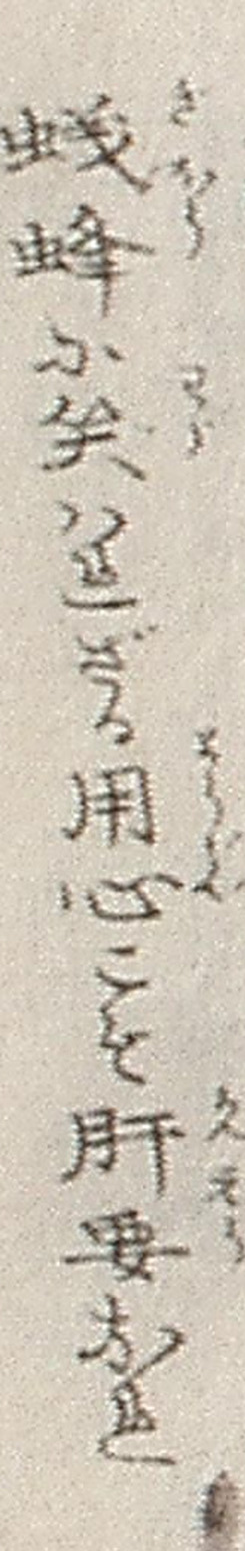蟻蜂に笑はれざる用心こそ肝要なれ

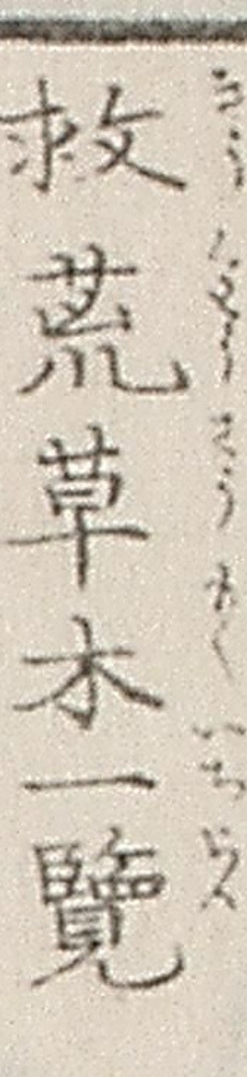救荒草木一覧
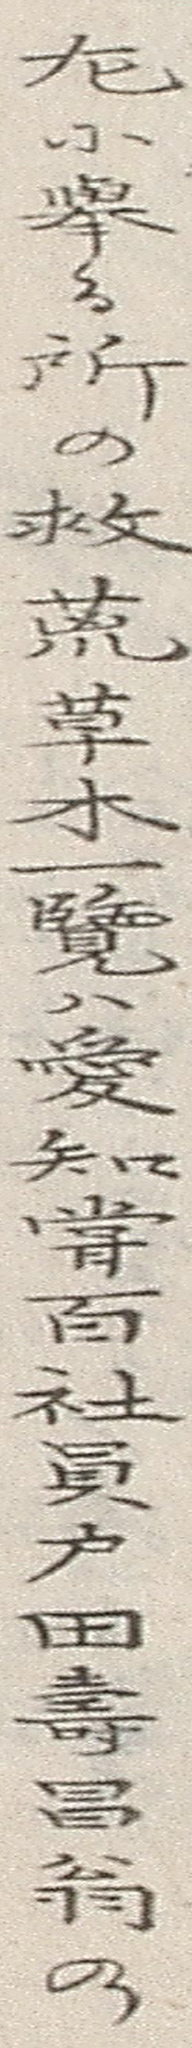左に挙る所の救荒草木一覧は愛知嘗百社員戸田寿昌翁の
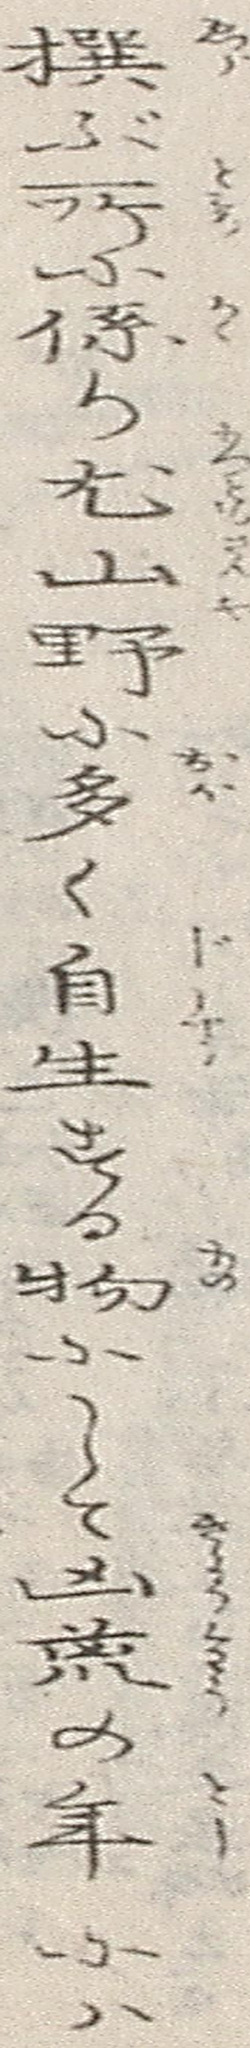撰ぶ所に係り尤山野に多く自生する物にして凶荒の年には
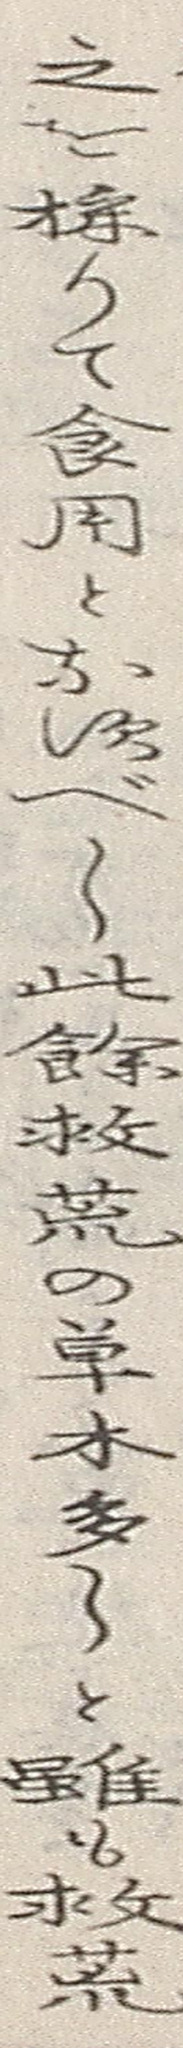之を採りて食用となすべし此余救荒の草木多しと雖も救荒
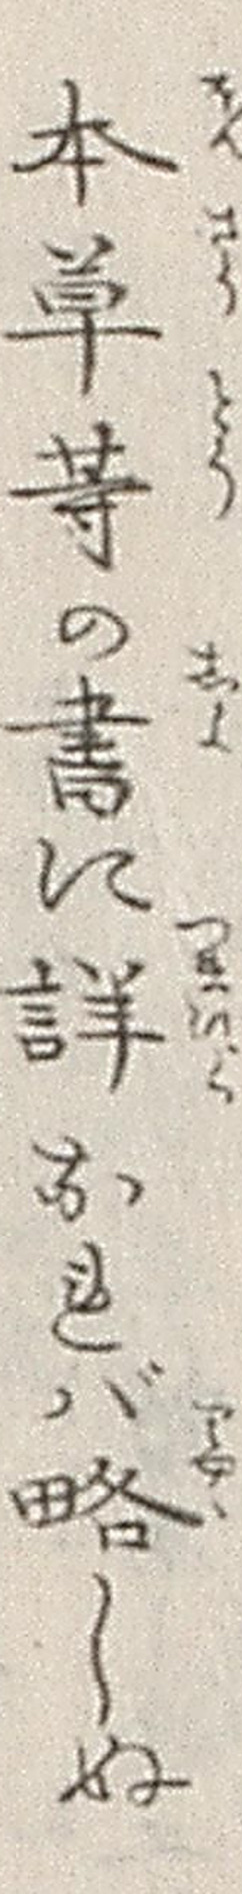本草等の書に詳なれば略しぬ
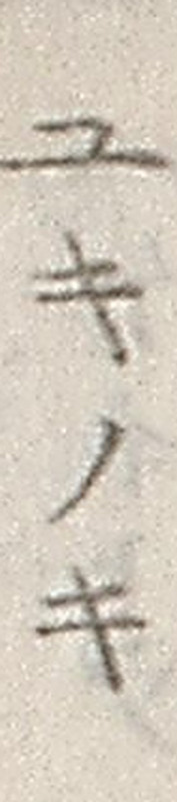ユキノキ
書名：凶荒図録　完
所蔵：東京大学地震研究所図書室 Earthquake Research Institute Library, The University of Tokyo, JAPAN
